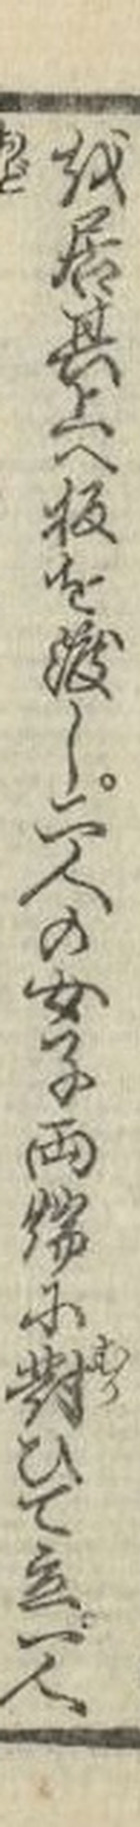を居其上へ板を渡し。二人の女子両端に対ひて立。一人
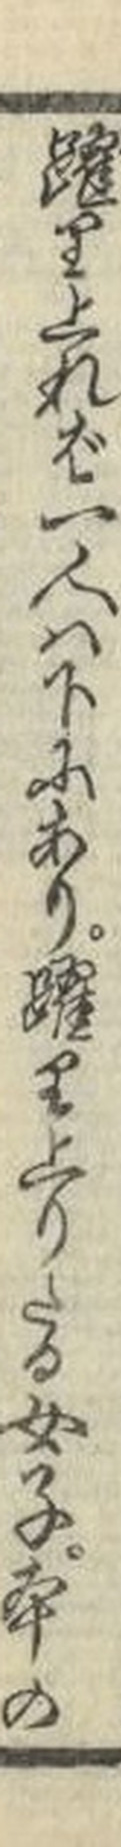躍り上れば一人は下にあり。躍り上りたる女子。本の
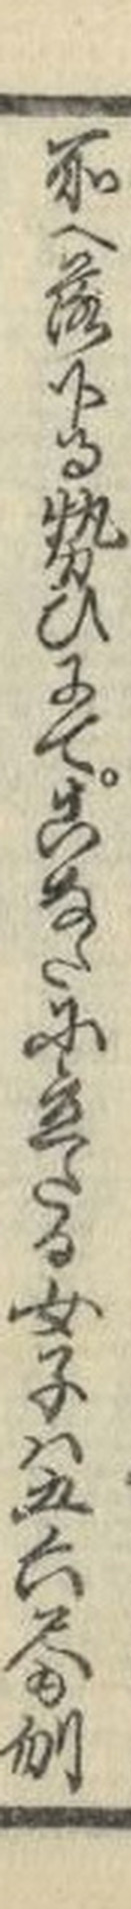所へ落下る勢ひにて。こなたに立たる女子は五六尺も刎
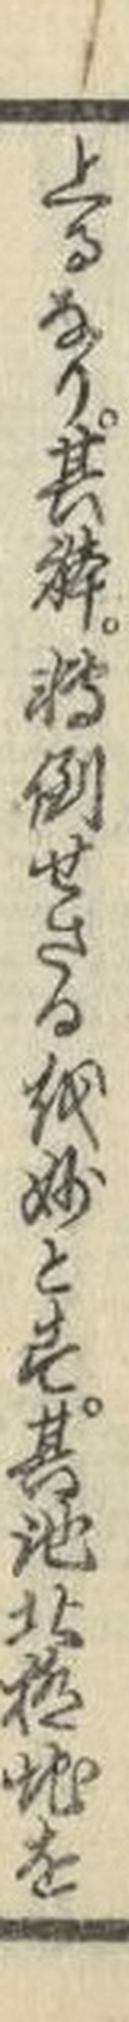上るなり。其体。転倒させるを妙とす。其地北極地を
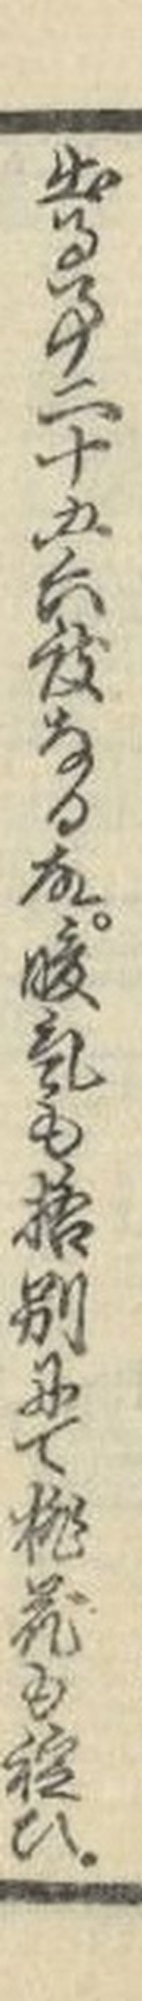出る事二十五六度なる故。暖気も格別にて桃花も綻ひ。
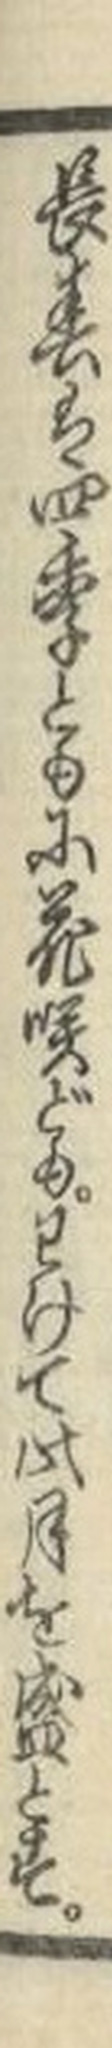長春は四季ともに花咲ども。わけて此月を盛とす。
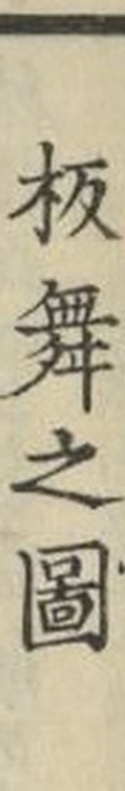板舞之図

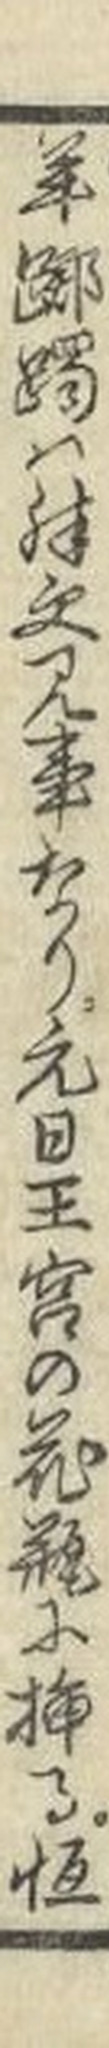羊躑躅は殊更見事なり。元日王宮の花瓶に挿る。恒
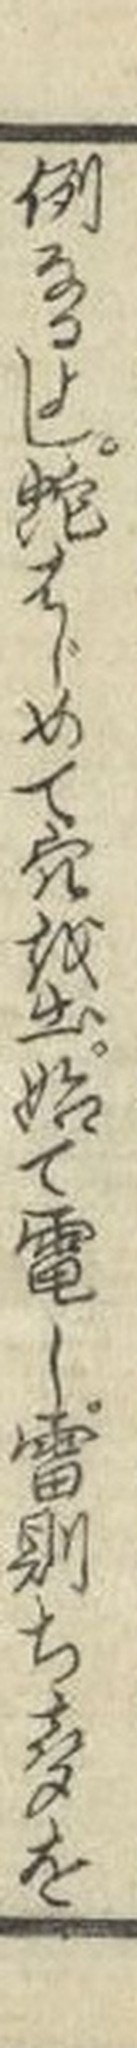例なるよし。蛇はじめて穴を出。始て電し。雷則ち声を
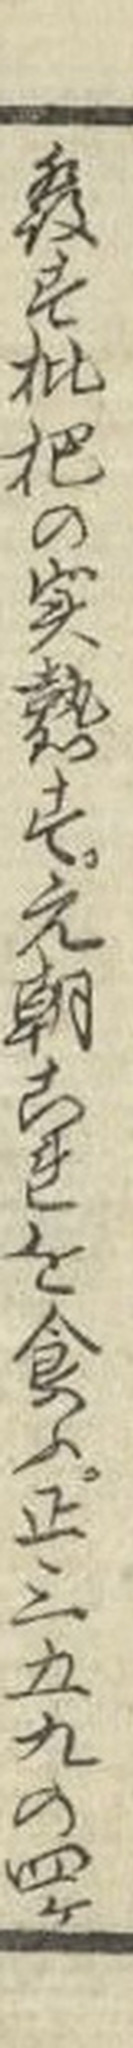発す枇杷の実熟す。元朝これを食ふ。正三五九の四ヶ
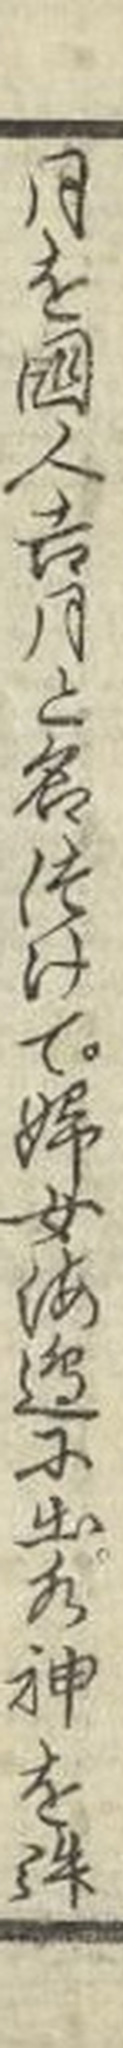月を国人吉月と名つけて。婦女海辺に出。水神を拝
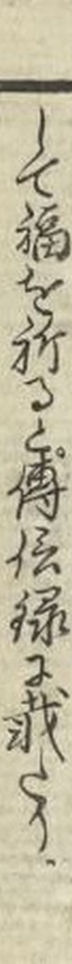して福を祈ると。伝信録に載たり。
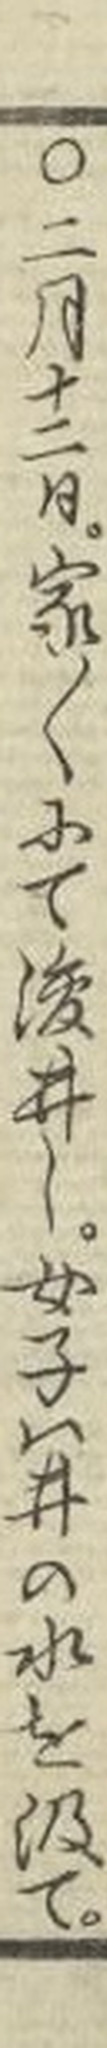○二月十二日。家〳〵にて浚井し。女子は井の水を汲て。
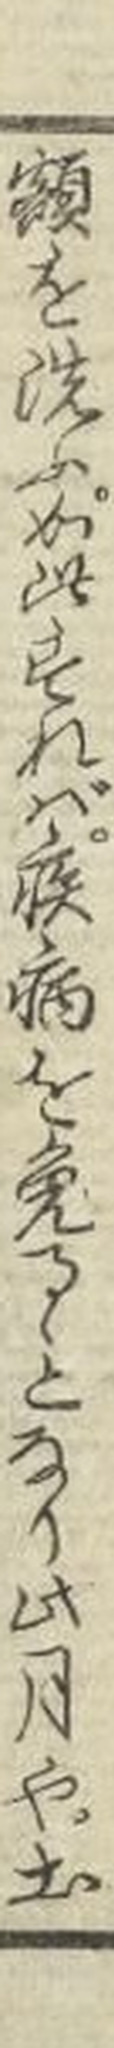額を洗ふ。如此すれば。疾病を免るゝとなり此月や。土
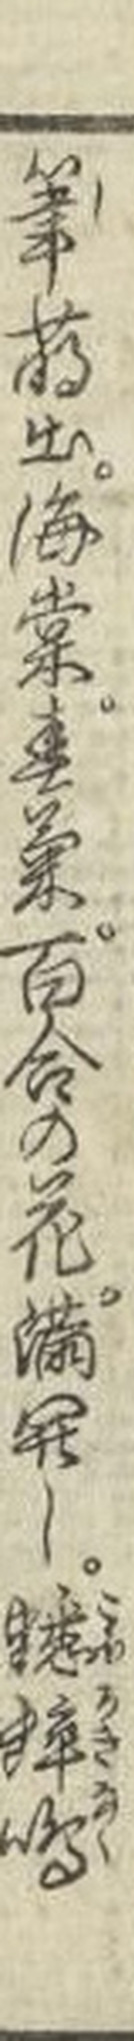筆萌出。海棠。春菊。百合の花。満開し。蟋蟀鳴
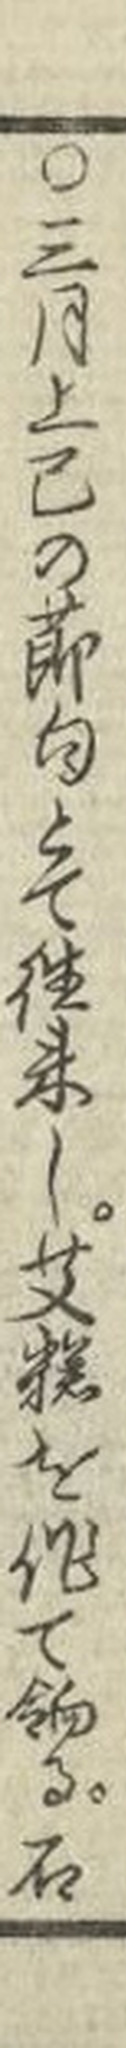○三月上己の節句とて往来し。艾糕を作てる。石
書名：琉球解語
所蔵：University of the Ryukyus Library
